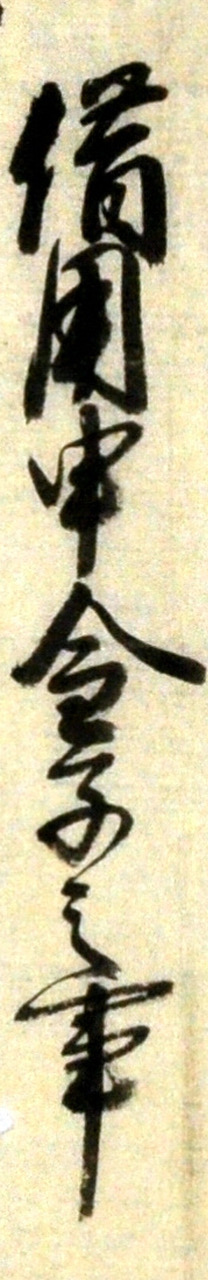借用申金子之事
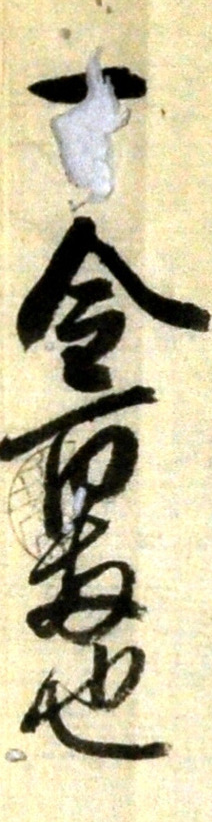一金百両也
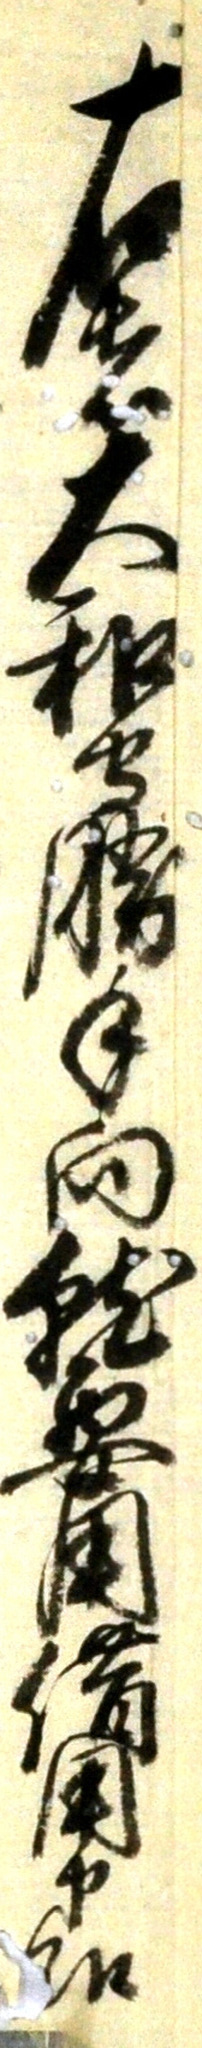右者大和守勝手向就要用借用申処
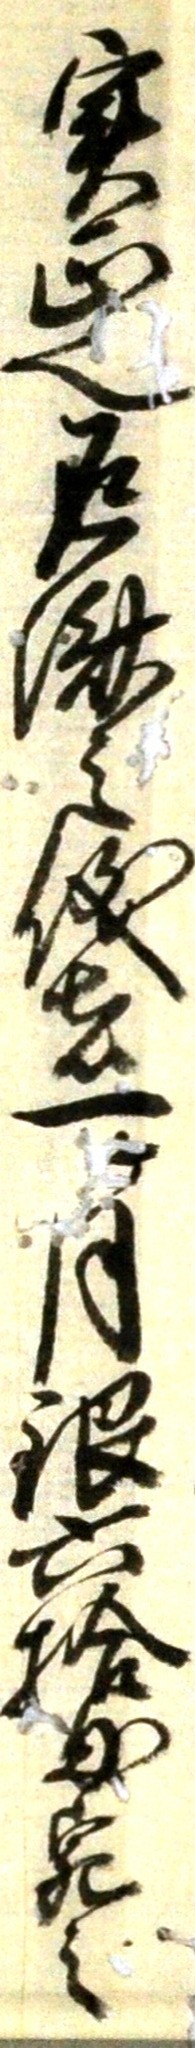実正也返済之儀者一ヶ月銀六拾匁宛之
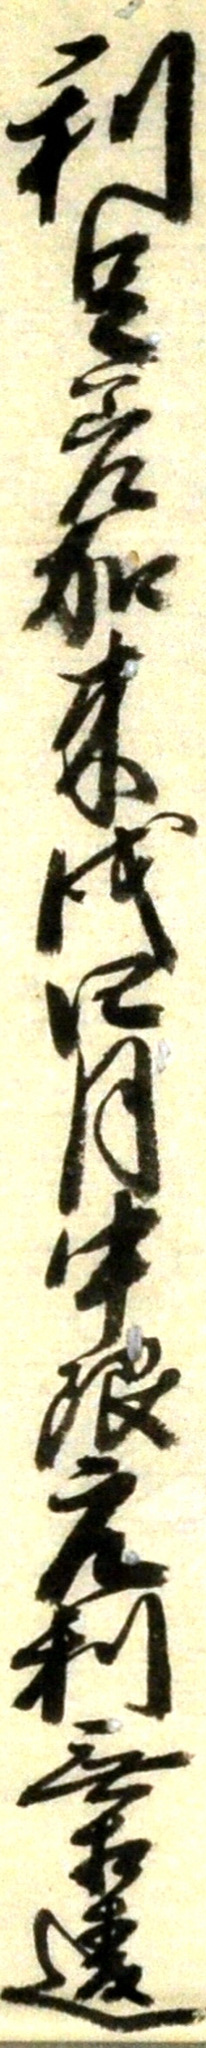利足差加来戌四月中限元利無相違
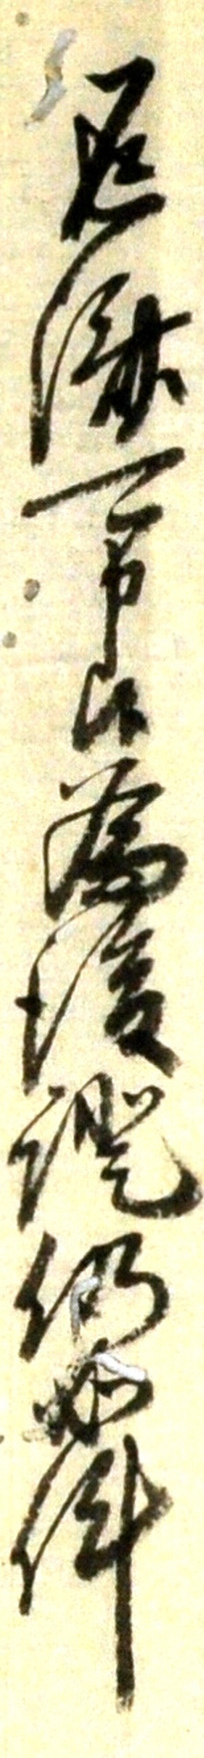返済可申候為後証仍如件
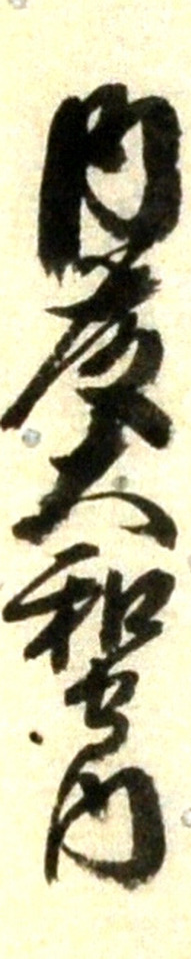内藤大和守内
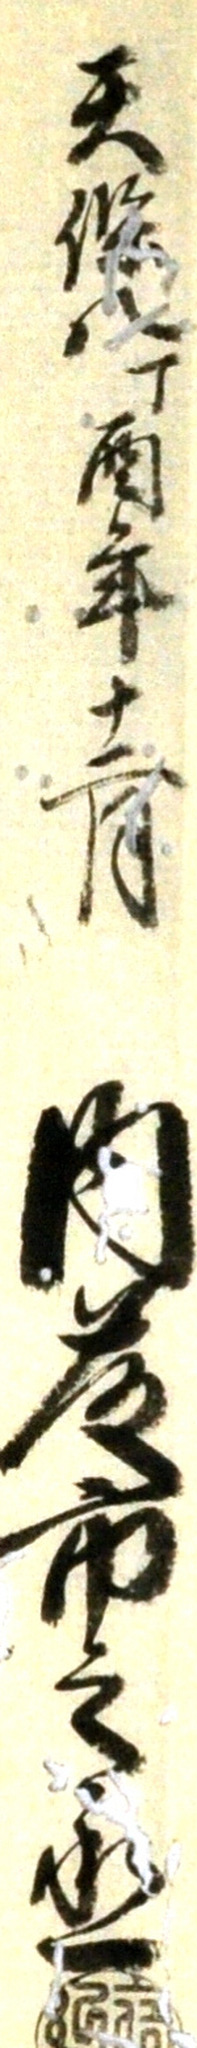天保八丁酉年十二月内藤市之丞
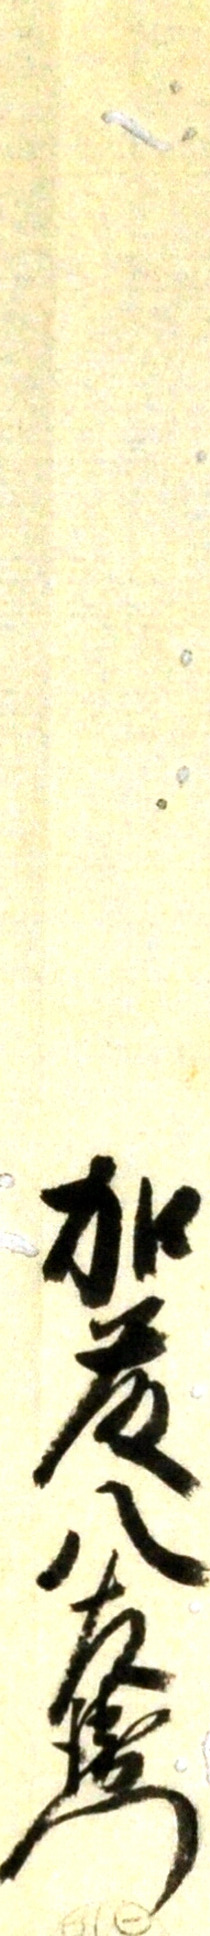加藤八左衛門
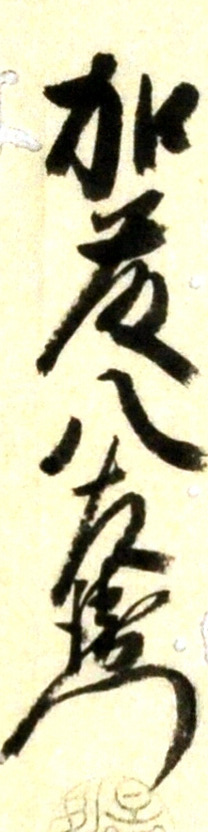加藤八左衛門
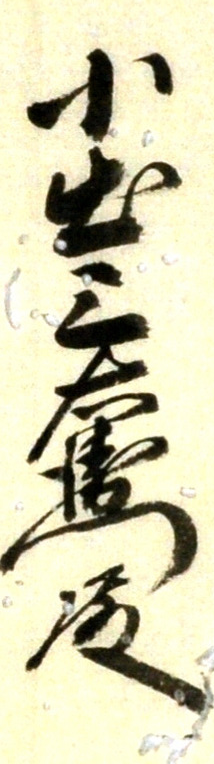小出三右衛門殿
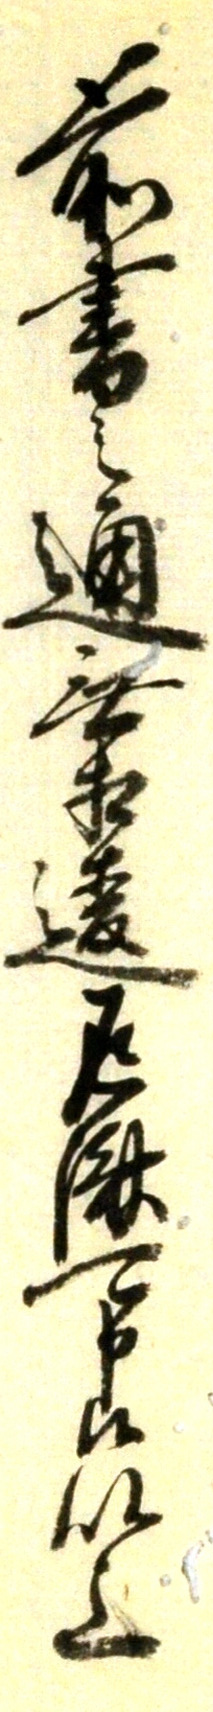前書之通無相違返済可申候以上
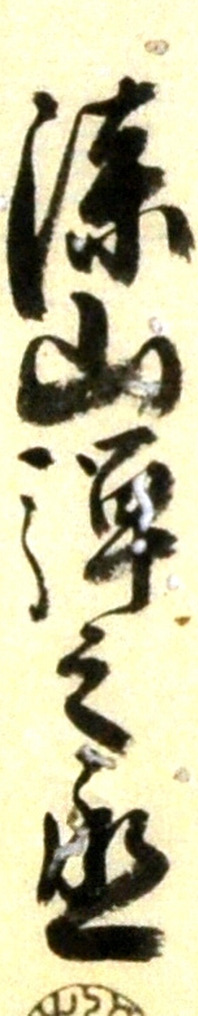深山騨之丞
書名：金子借用証文
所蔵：伊那市立高遠町図書館・合同会社AMANE
